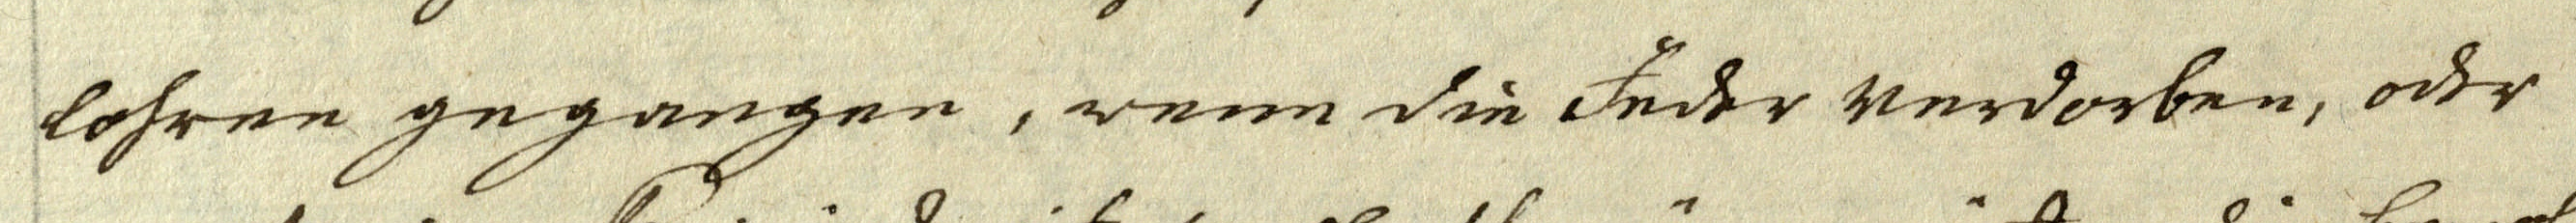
lohren gegangen, wenn die Feder verdorben, oder
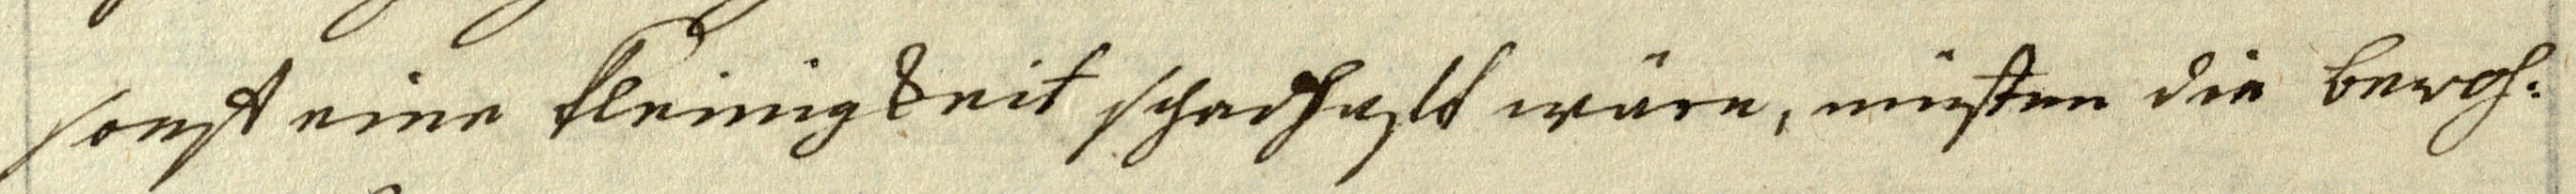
sonst eine Kleinigkeit schadhaft wäre, müsten die Bewoh¬
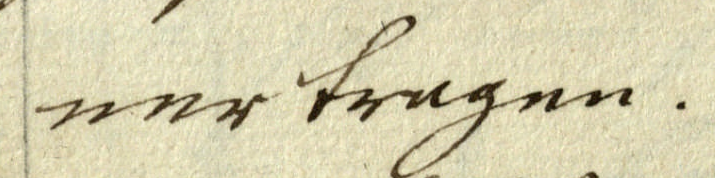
ner tragen.
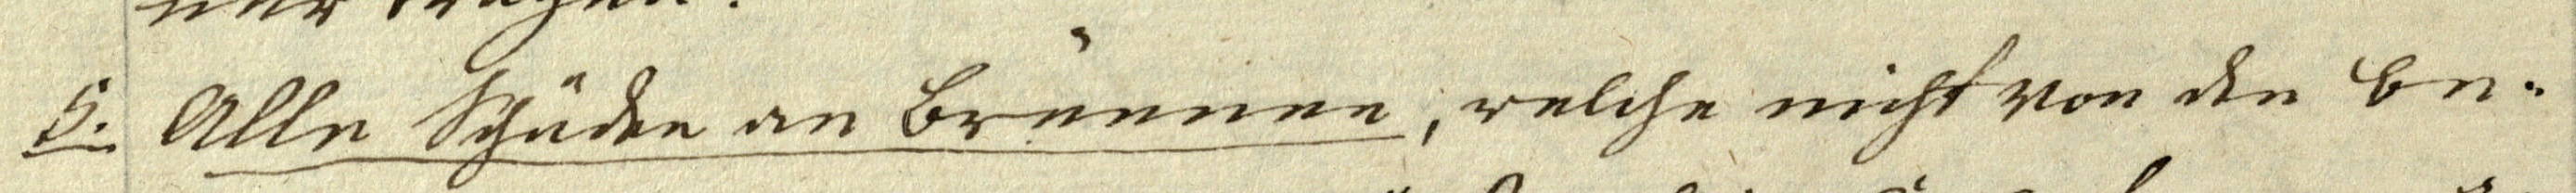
5. Alle Schäden an Brunnen, welche nicht von den Be¬
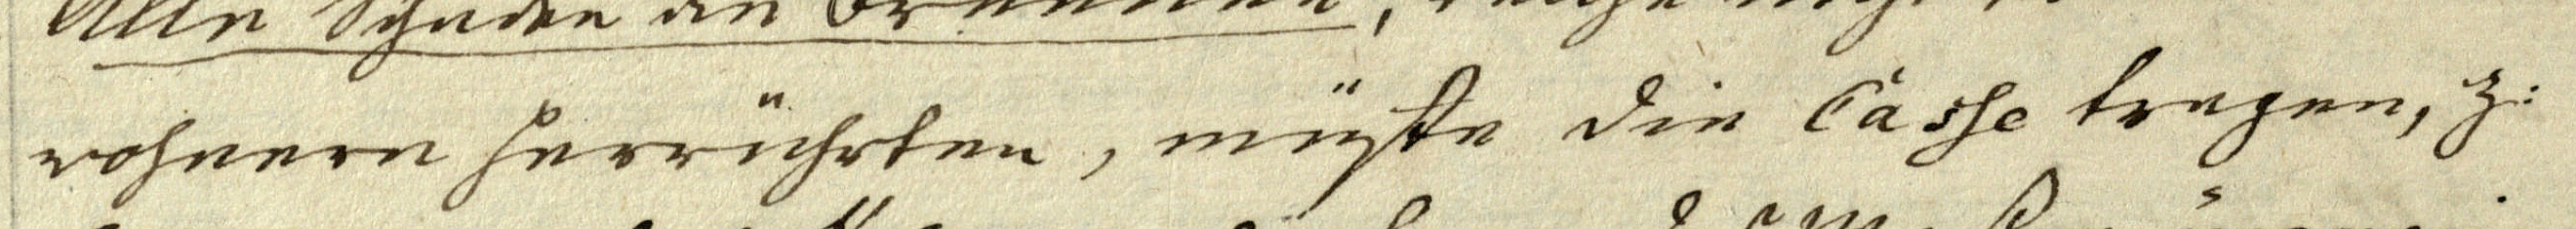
wohnern herrührten, müste die Casse tragen, z.
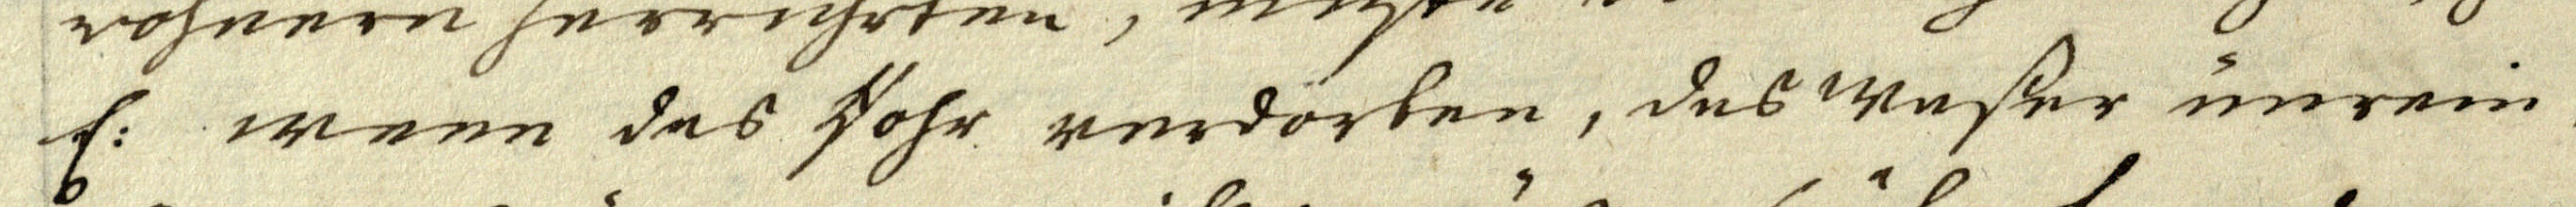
E. wenn das Rohr verdorben, das Wasser unrein,
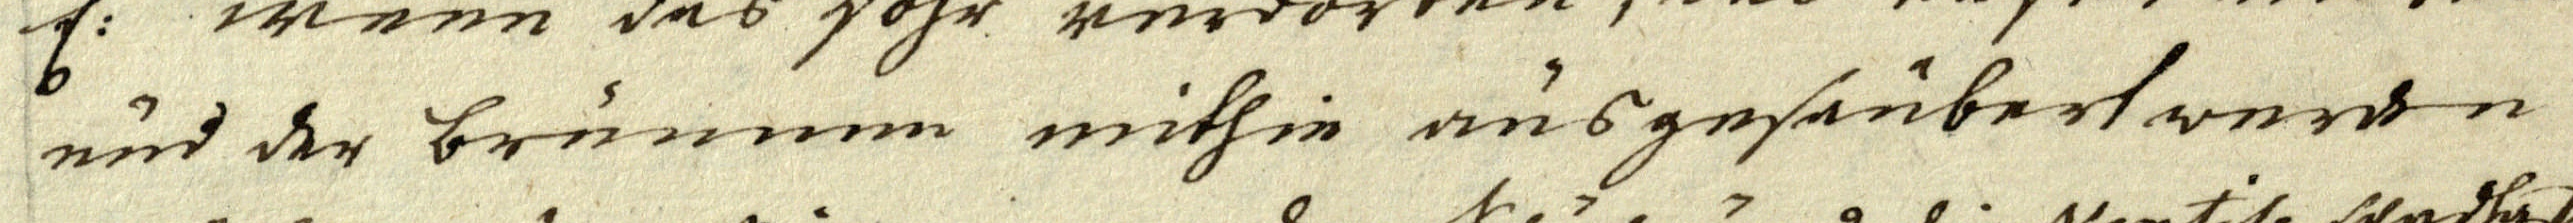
und der Brunnen mithin ausgesäubert werden
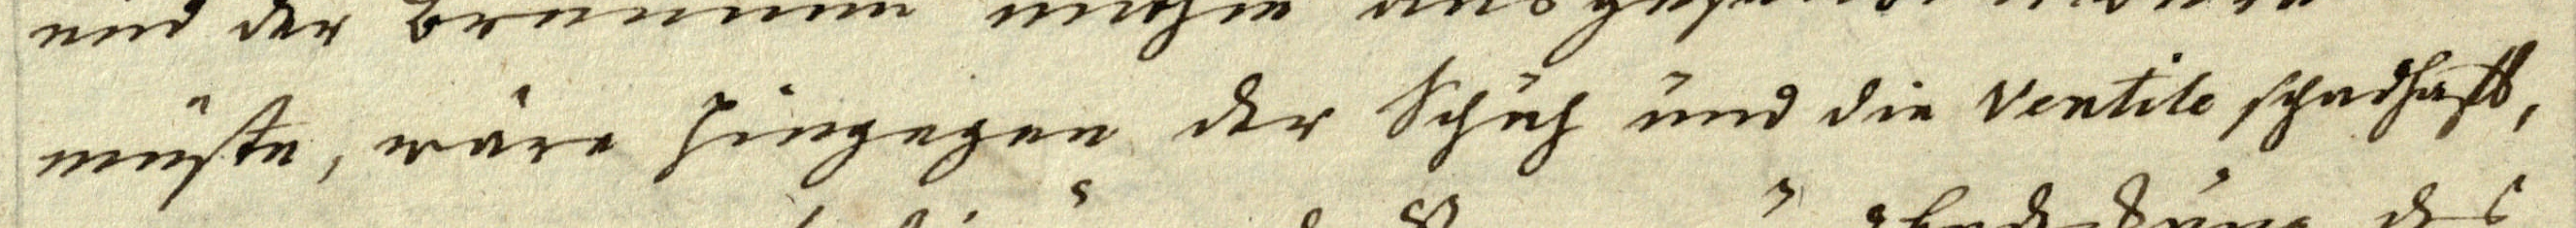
müste, wäre hingegen der Schuh und die Ventile schadhaft,
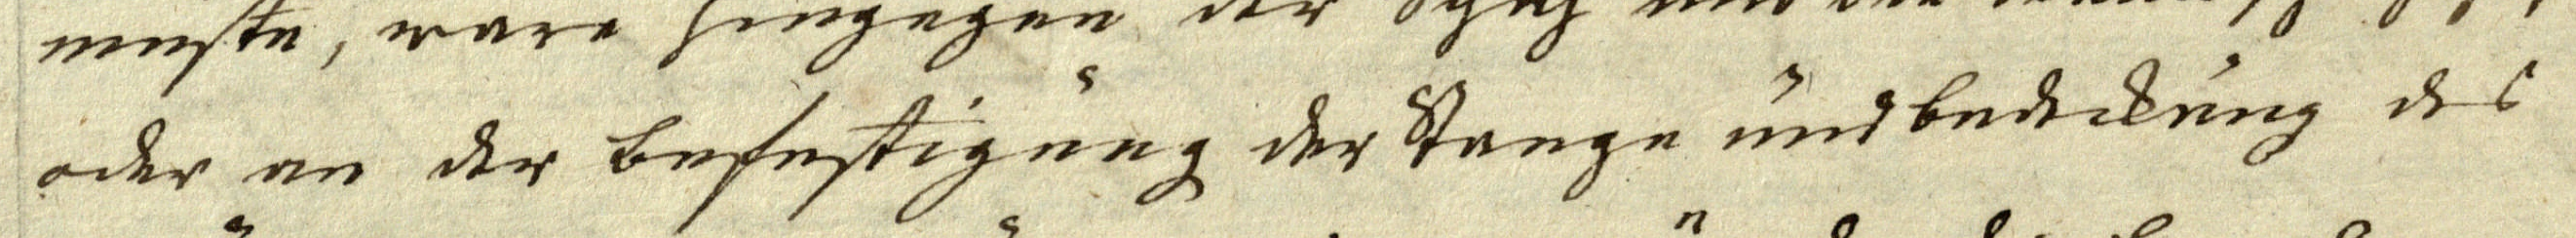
oder an der Befestigung der Stange und Bedeckung des
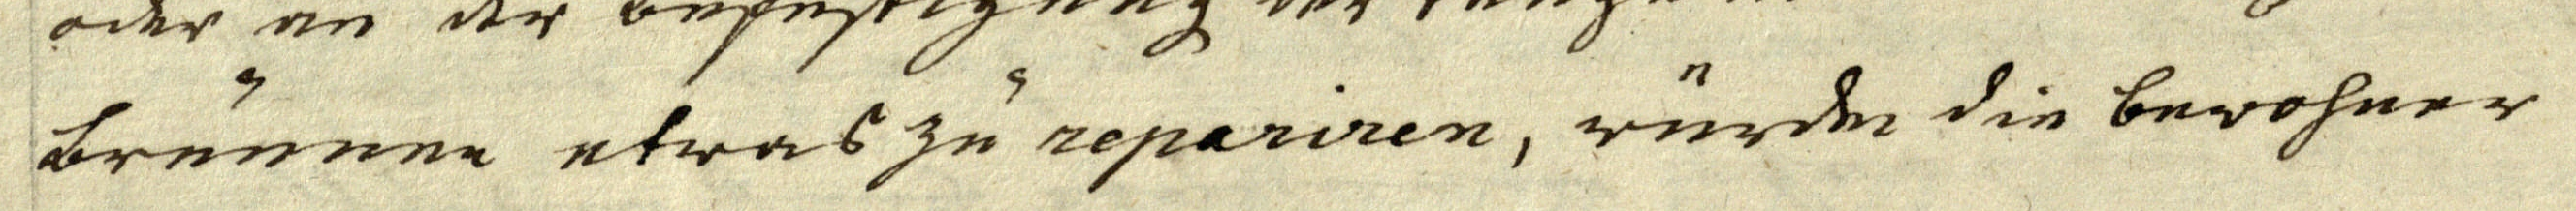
Brunnen etwas zu repariren, würden die Bewohner
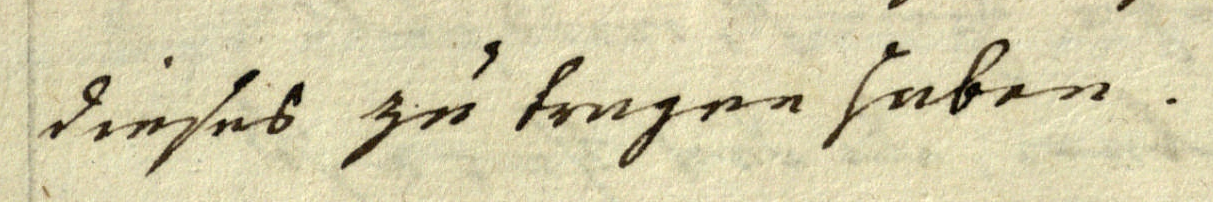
dieses zu tragen haben.
